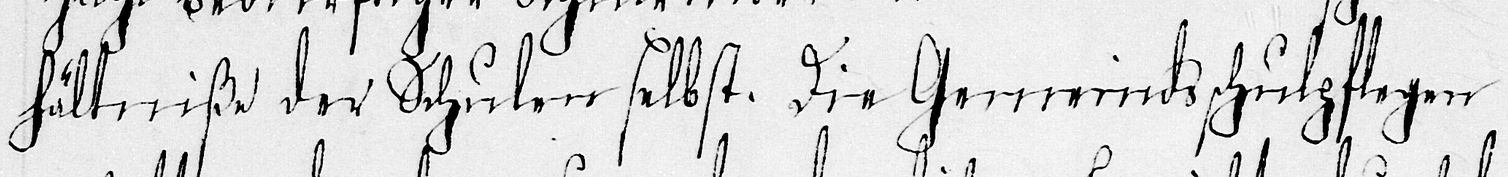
hältniße der Schulen selbst. Die Gemeindsschulpflegen
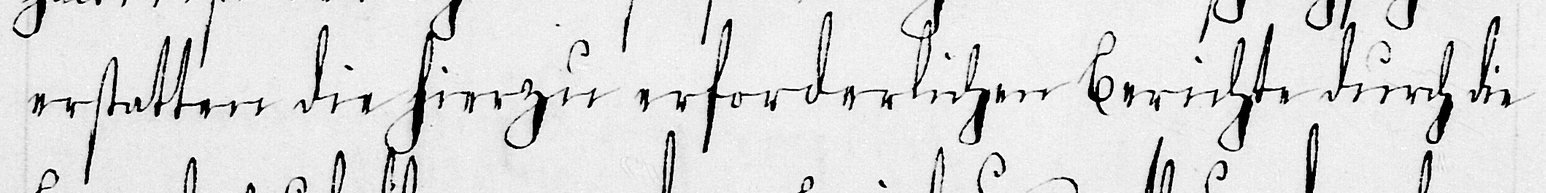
erstatten die hierzu erforderlichen Berichte durch die
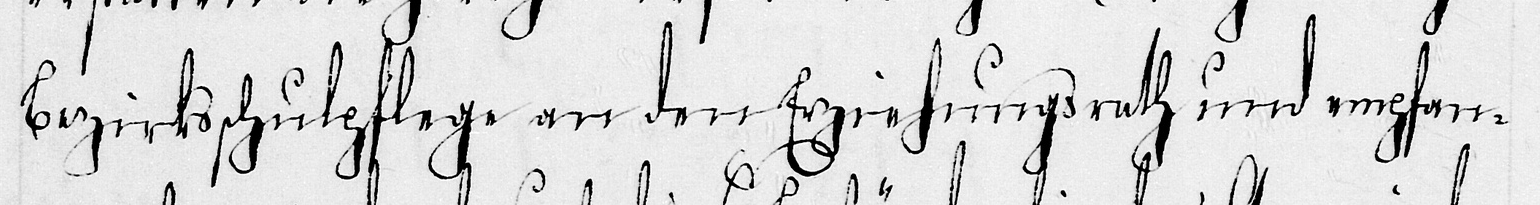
Bezirksschulpflege an den Erziehungsrath und empfan¬
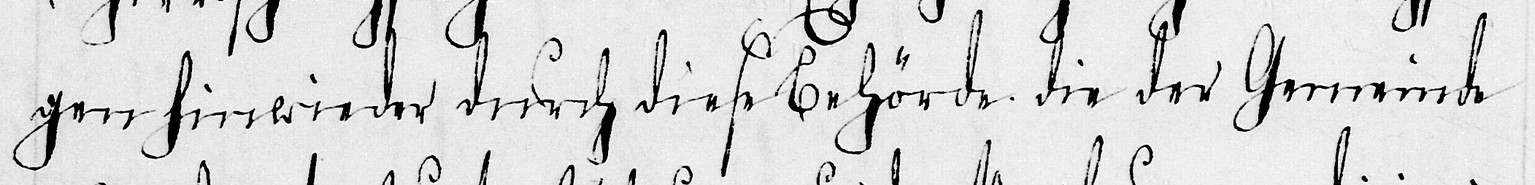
gen hinwieder durch diese Behörde die der Gemeinde
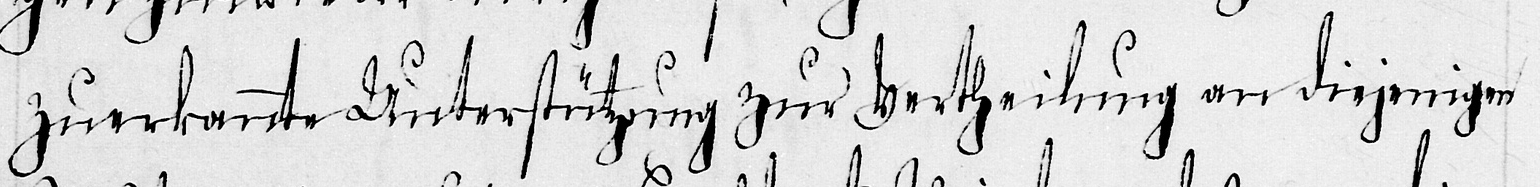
zuerkannte Unterstützung zur Vertheilung an diejenigen
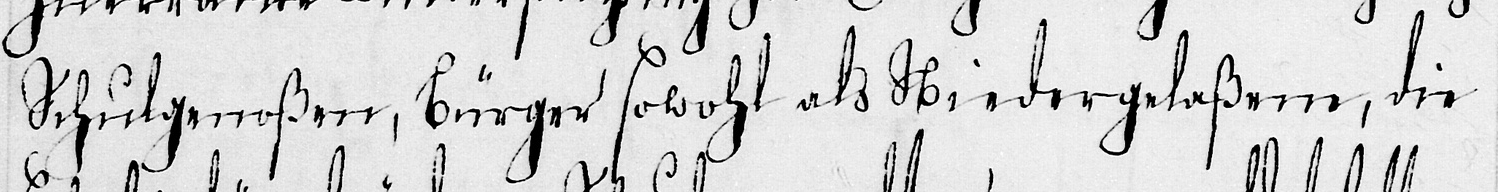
Schulgenoßen, Bürger sowohl als Niedergelaßene, die
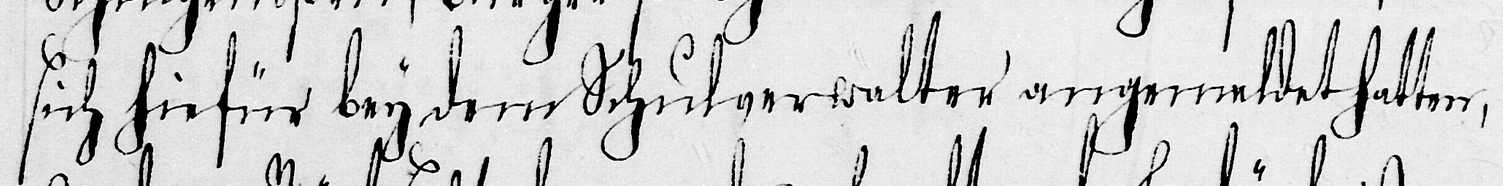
sich hiefür bey dem Schulverwalter angemeldet hat¬
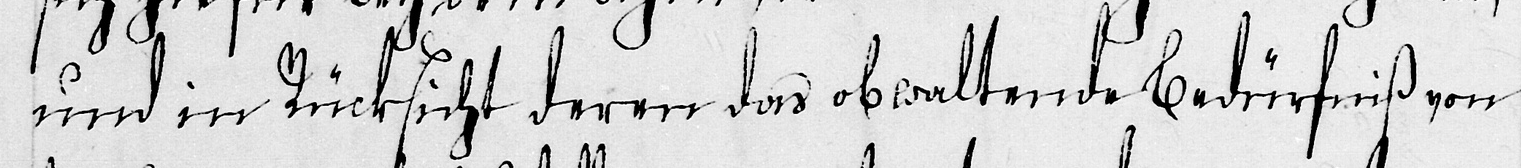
und in Rücksicht deren das obwaltende Bedürfniß von
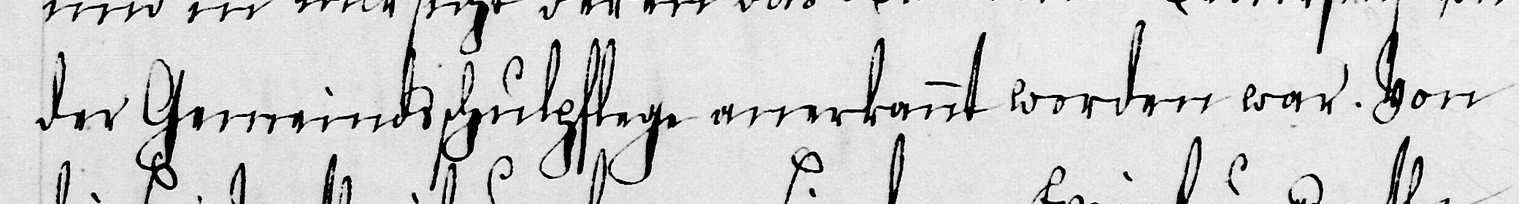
der Gemeindsschulpflege anerkannt worden war. Von
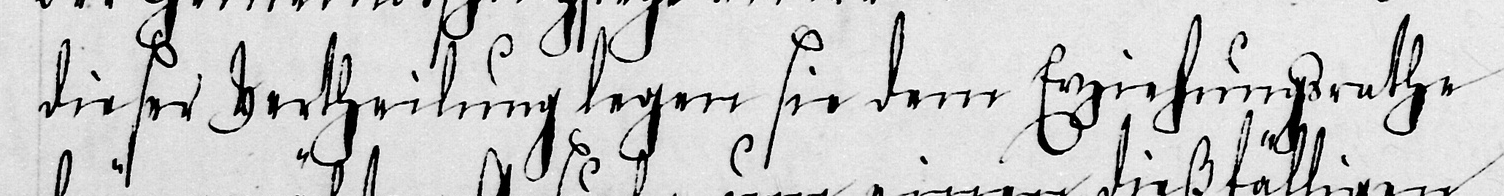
dieser Vertheilung legen sie dem Erziehungsrathe
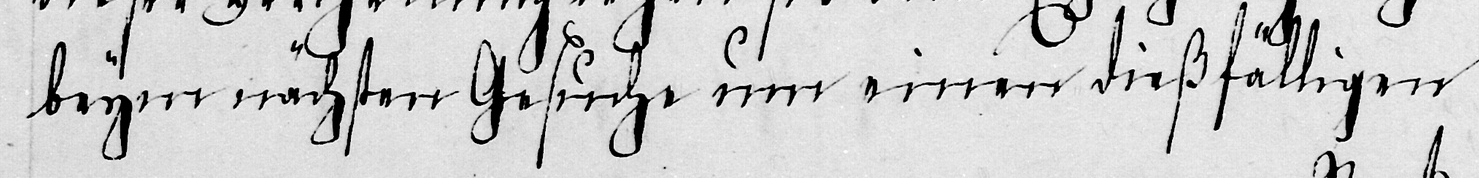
beym nächsten Gesuche um einen dießfälligen
